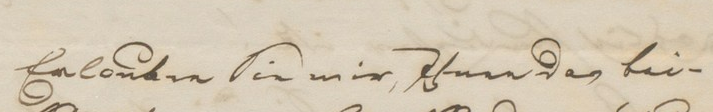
Erlauben Sie mir, Ihnen das bei-
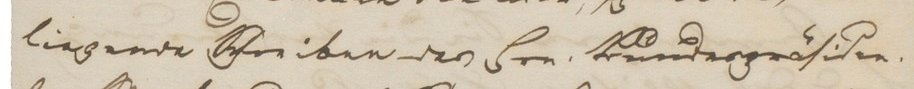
liegende Schreiben des Hrn. Bundespräsiden-
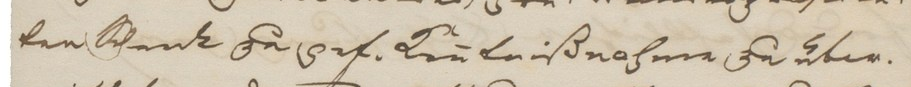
ten Schenk zu gef. Kenntnißnahme zu über-
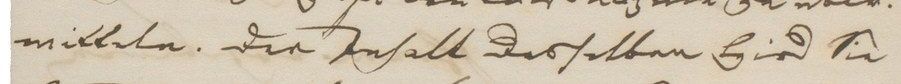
mitteln. Der Inhalt desselben wird Sie
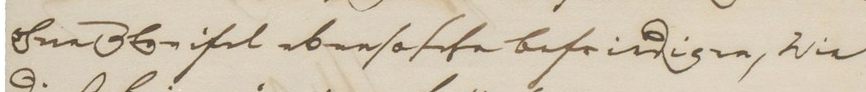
ohne Zweifel ebensosehr befriedigen, wie
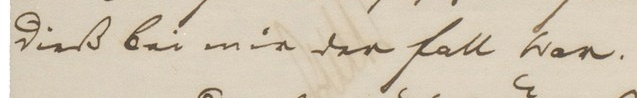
dieß bei mir der Fall war.
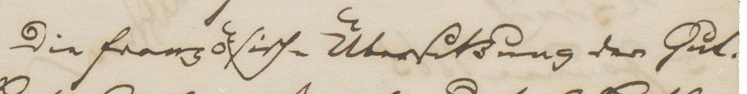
Die französische Übersetzung des Gut-
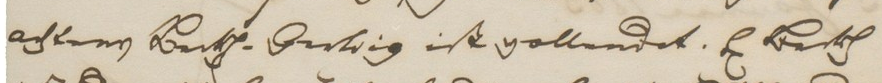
achtens Beckh-Gerwig ist vollendet. Hr Beckh
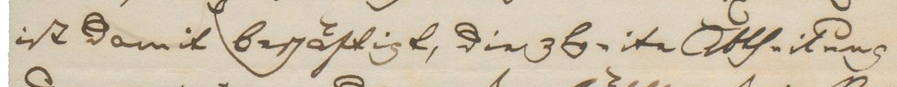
ist damit beschäftigt, die zweite Abtheilung
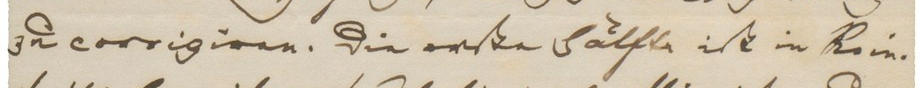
zu corrigiren. Die erste Hälfte ist in Rein-
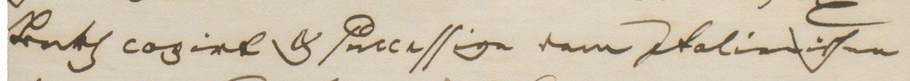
Beckh copirt & successive dem Italienischen
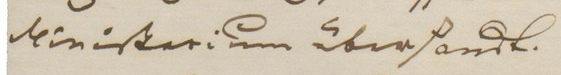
Ministerium übersandt.
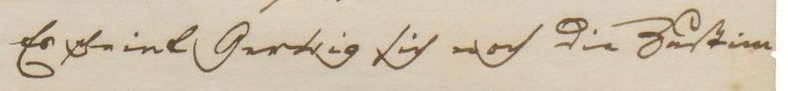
Es scheint Gerwig sich noch die Zustim-
